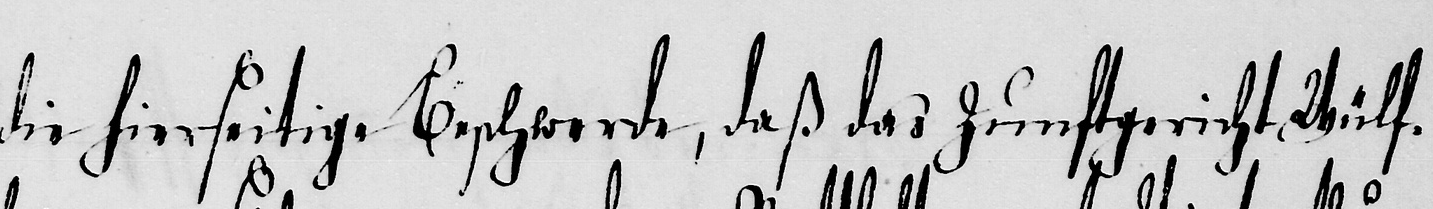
die hierseitige Beschwerde, daß das Zunftgericht Wülf¬
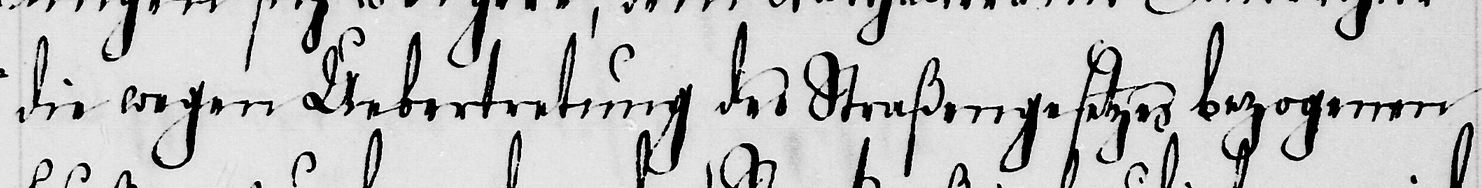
die wegen Uebertretung des Straßengesetzes bezogenen
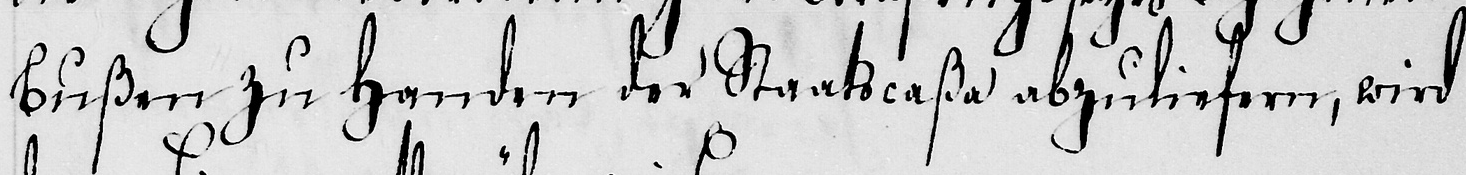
Bußen zu Handen der Staatscaßa abzuliefern, wird
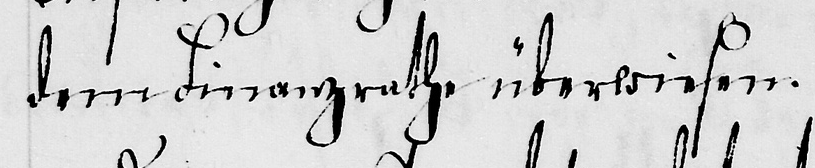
dem Finanzrathe überwiesen.
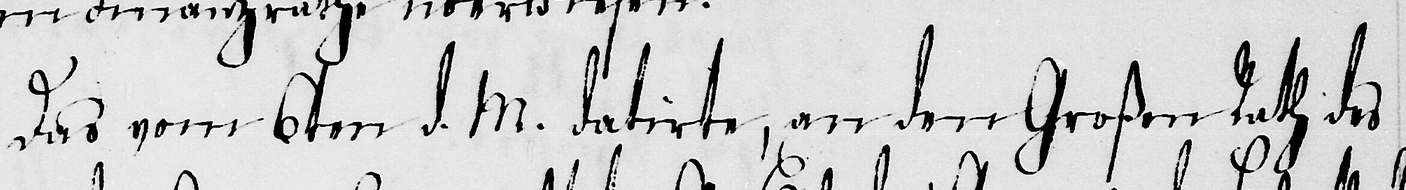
Das vom 6ten d. M. datirte, an den Großen Rath des
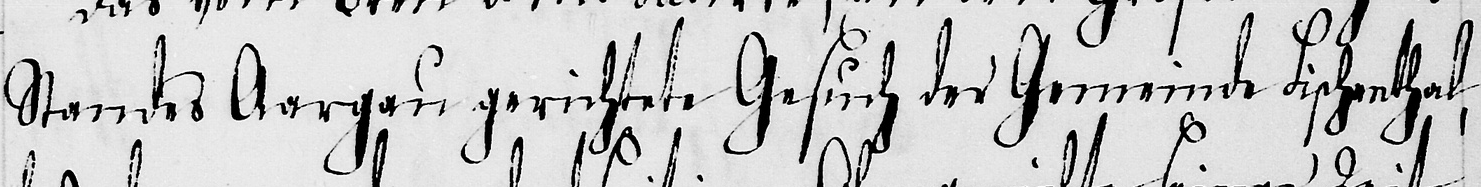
Standes Aargau gerichtete Gesuch der Gemeinde Fischenth¬
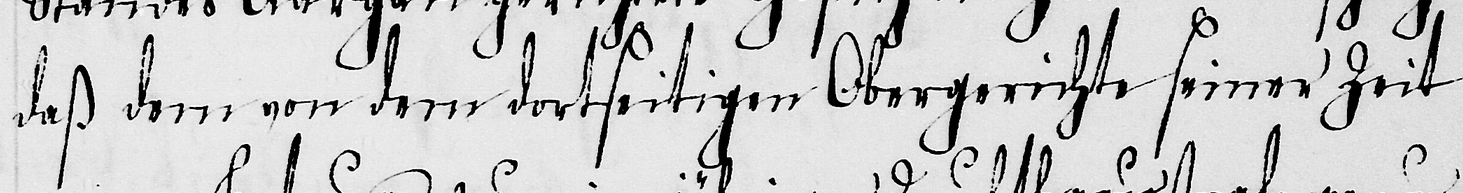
daß dem von dem dortseitigen Obergerichte seiner Zeit
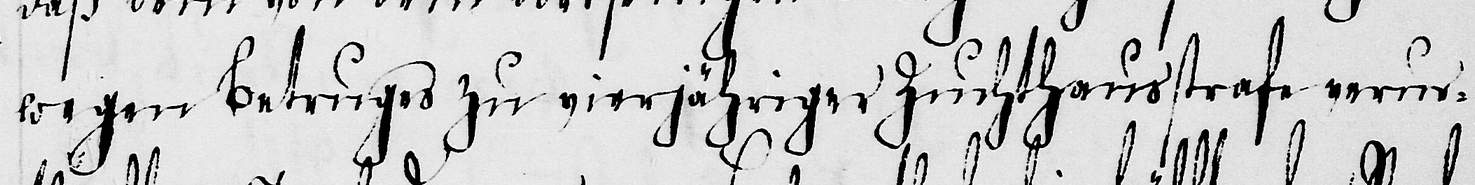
wegen Betruges zu vierjähriger Zuchthausstrafe verur¬
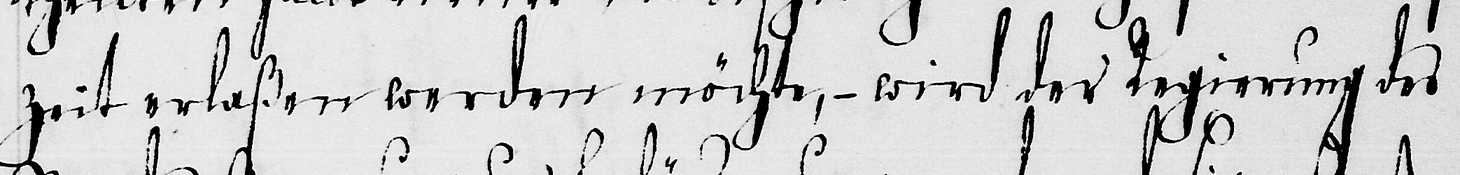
zeit erlaßen werden möchte, – wird der Regierung des
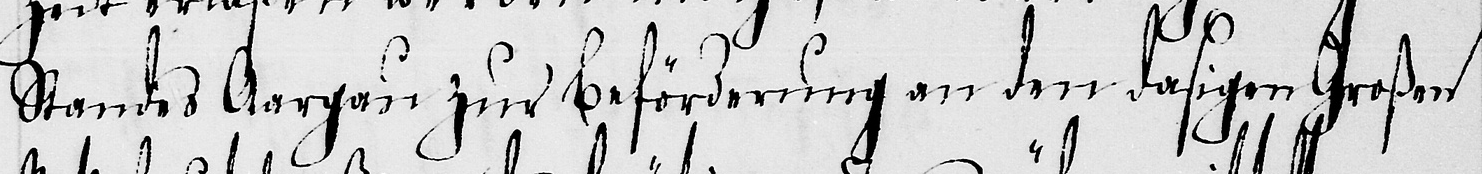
Standes Aargau zur Beförderung an den dasigen Großen
